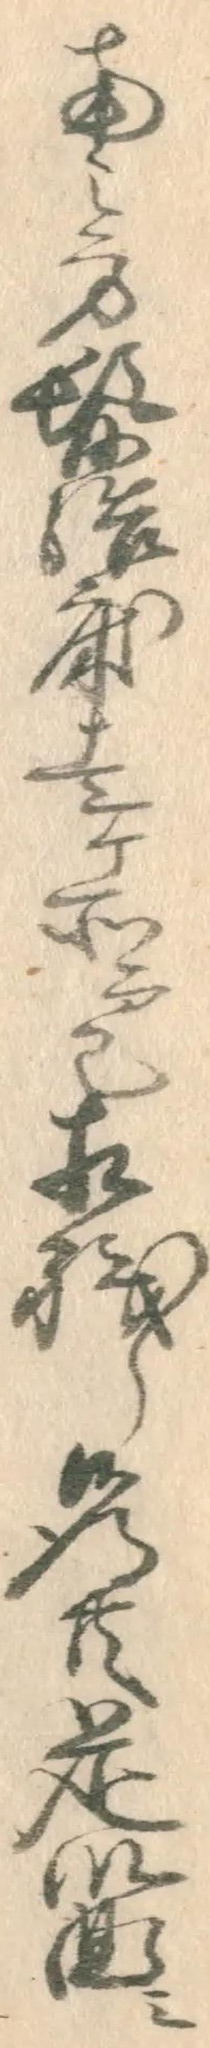南之方髪結床壱ケ所而已相残り候得共是以曲ミ
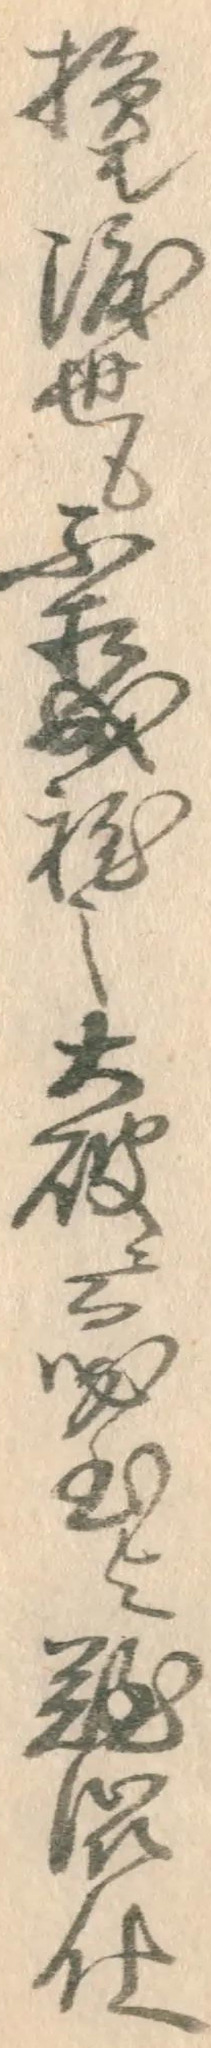損シ渡世も不相成程之大破ニ而必至と難渋仕
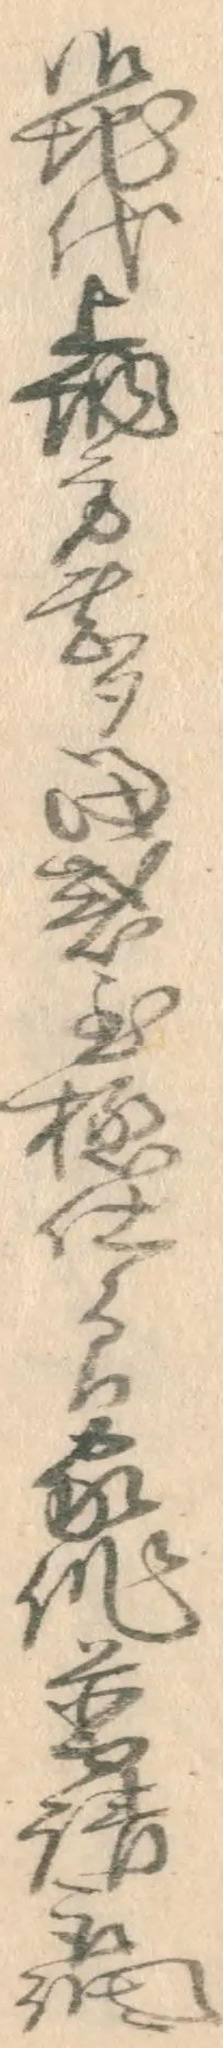御地代上納方甚タ当惑至極仕候間家作普請取調
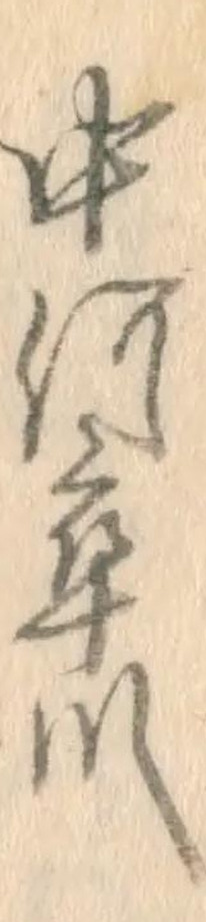中何卒以
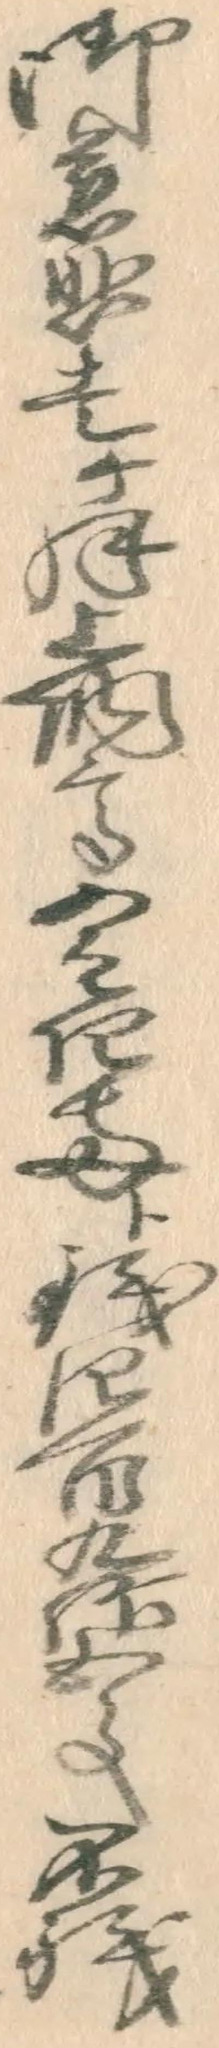御慈悲壱ケ月上納高金四両ト銭四百九拾五文不残
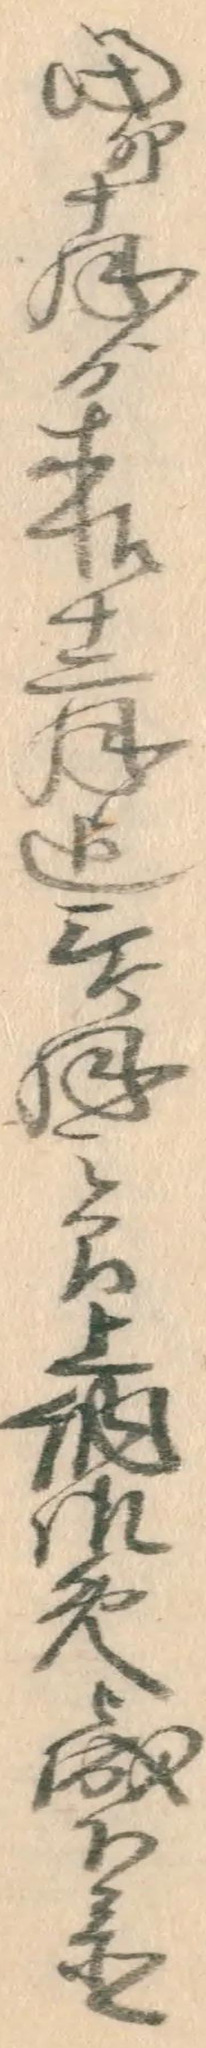当卯十月ゟ来ル十二月迄三ケ月之間上納御免被成下置
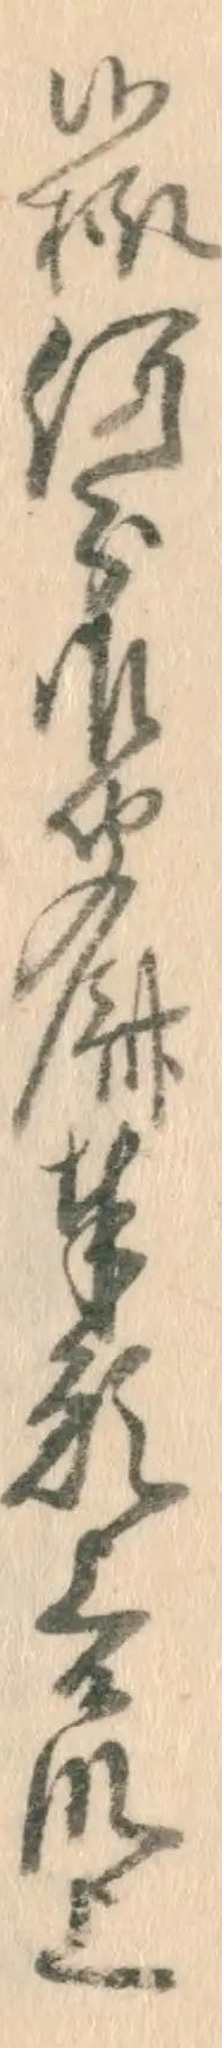候様何分御聞済奉願上候以上
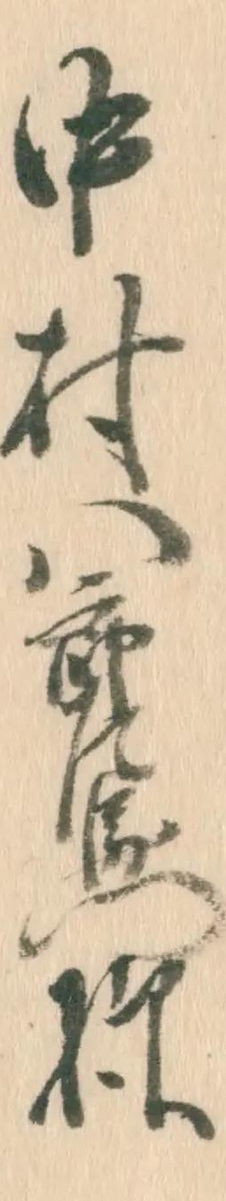中村八郎左衛門様
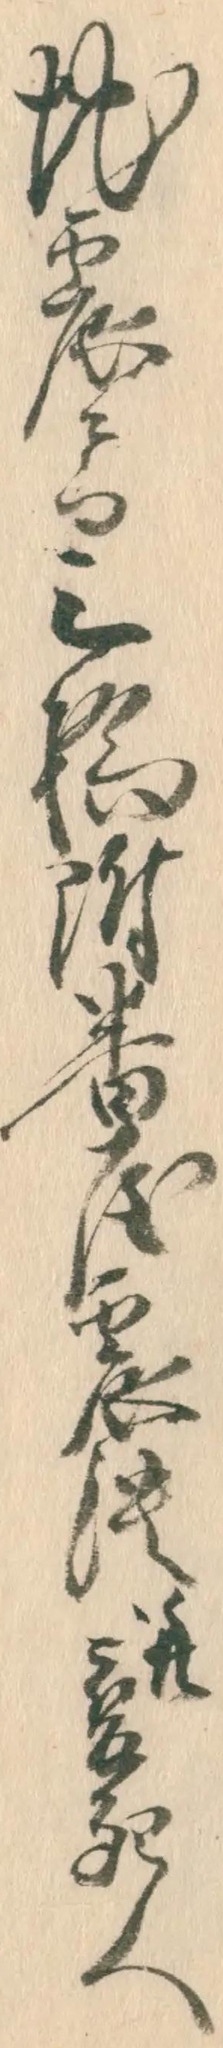地震ニ而三橋附番屋震潰并変死人
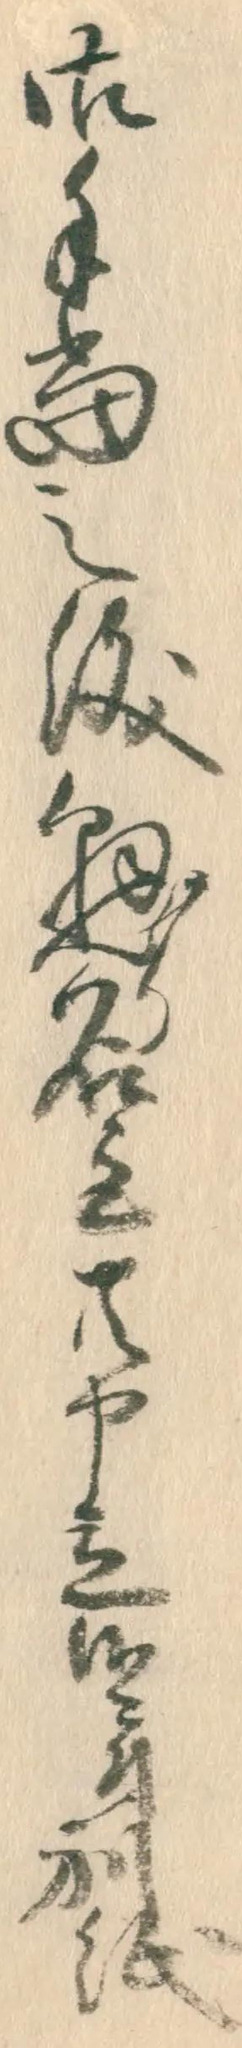御手当之儀懸り名主共申立候ニ付別紙
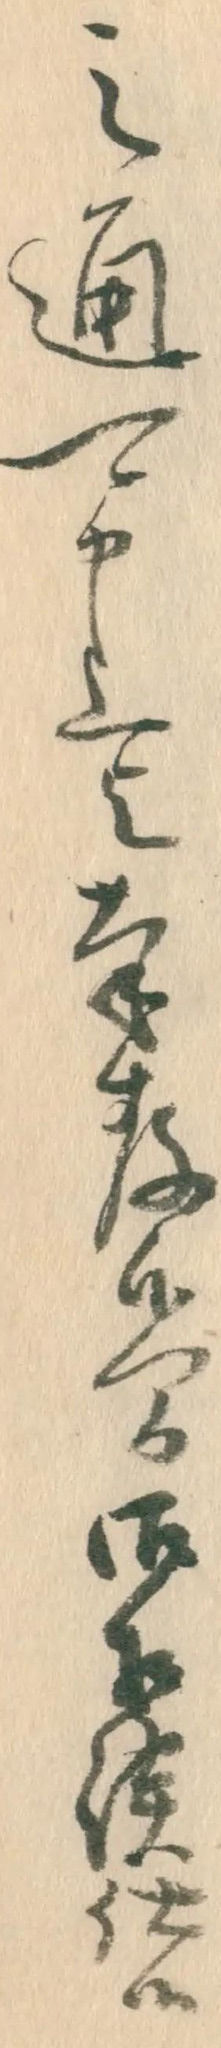之通可申上と奉存候間御相談仕候

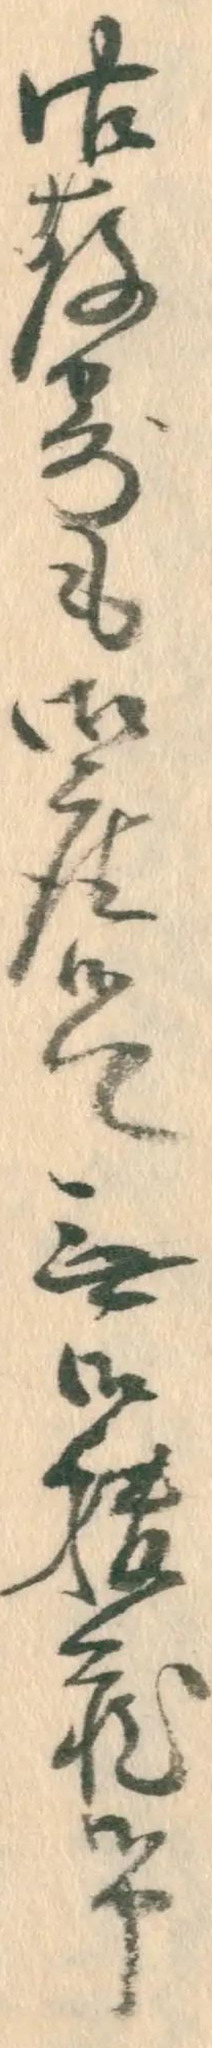御存寄も御座候ハヽ無御腹蔵御申
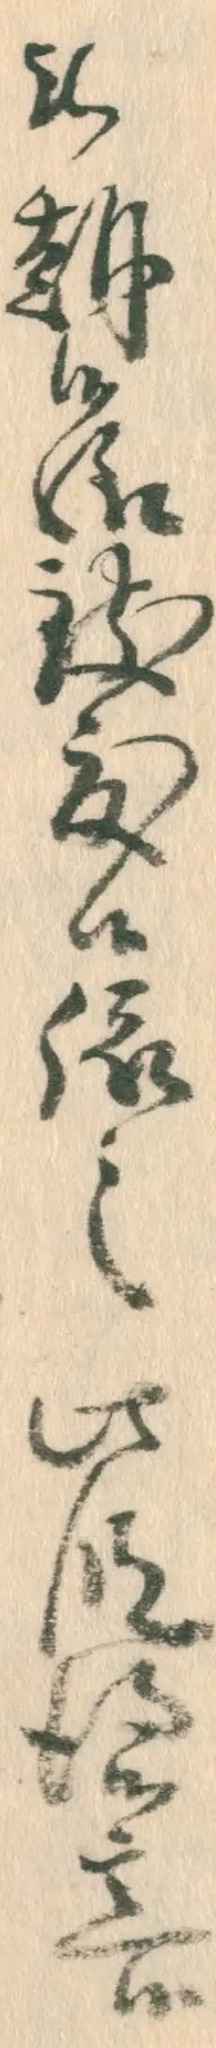被越候様致度候依之此段得御意候
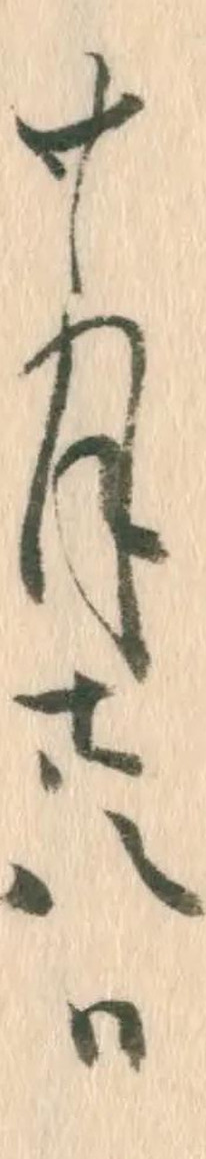十月廿八日
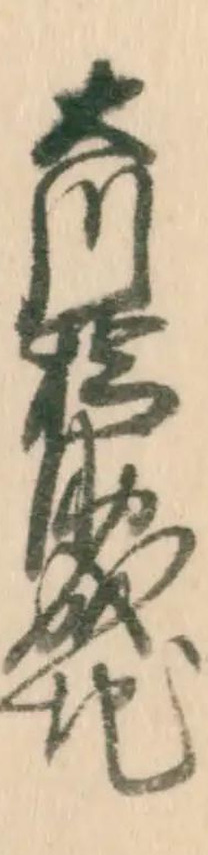大川橋助成地
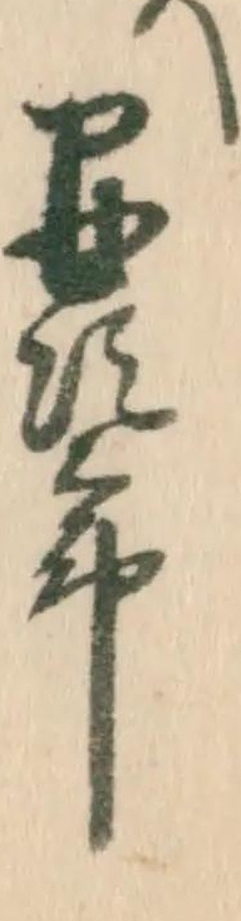安次郎
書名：三橋 17巻. [8] 三橋小破御修復書留　但御奉行御掛リ替地震潰橋番屋　嘉永四亥年より安政二卯年迄　下
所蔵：国立国会図書館 National Diet Library, JAPAN
